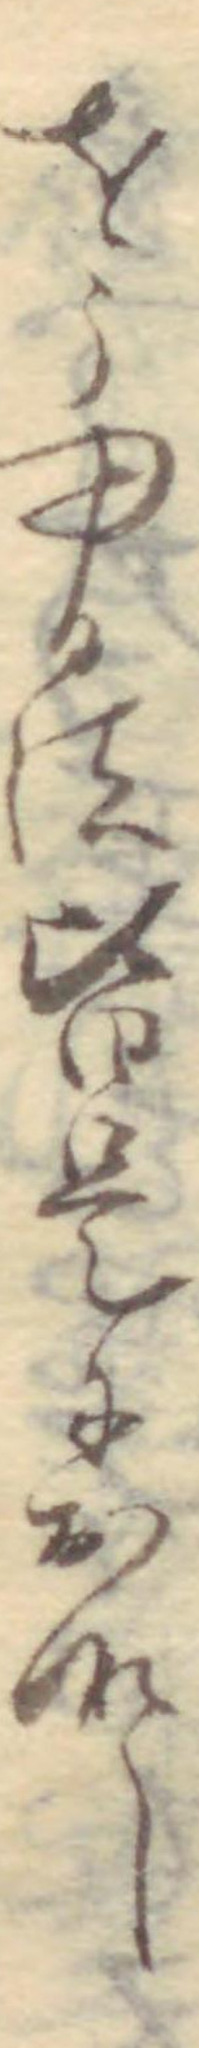をうゆる法皆是におなし
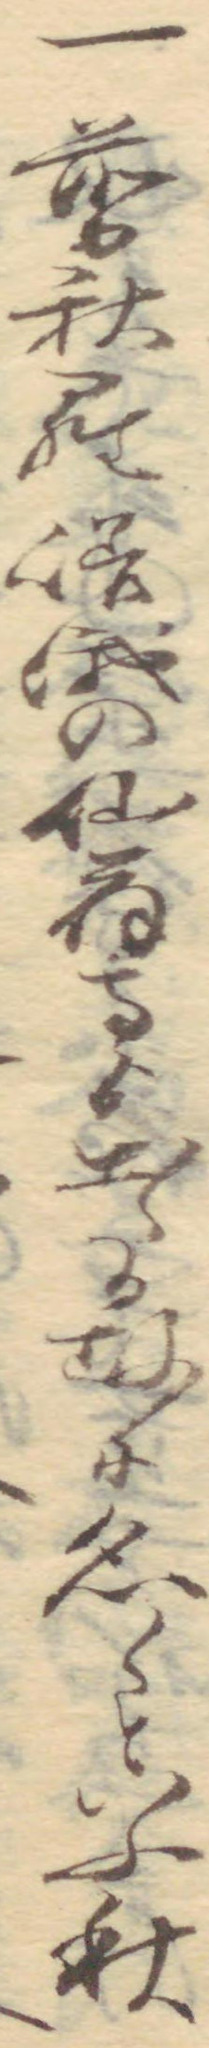一前に秋羅嵯峨の仙翁寺ゟ出たる故に名くといふ秋
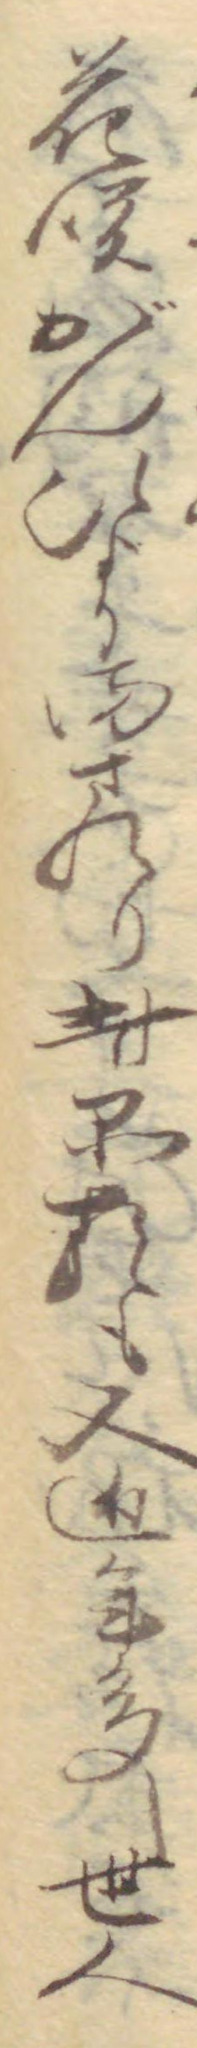花咲がんひよりまされり此品類も又近年多し世人
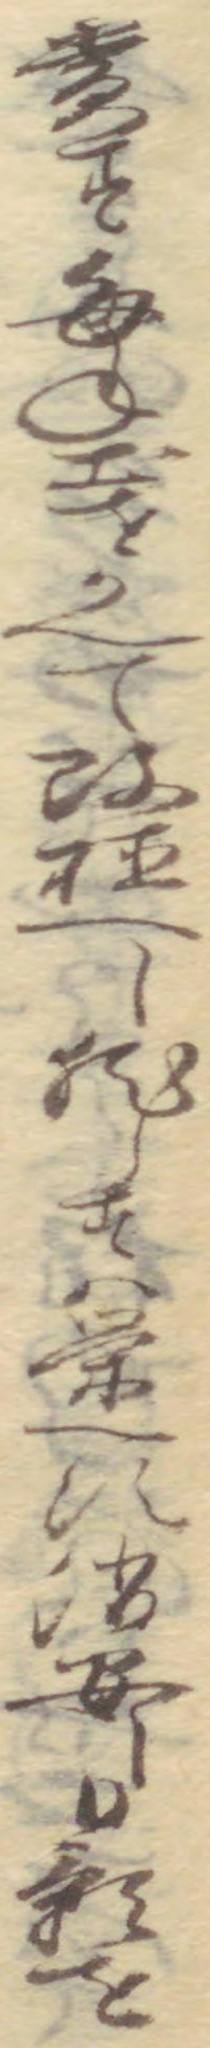賞す毎年土をかへて改植へし然らすハ栄へす消安し日影を
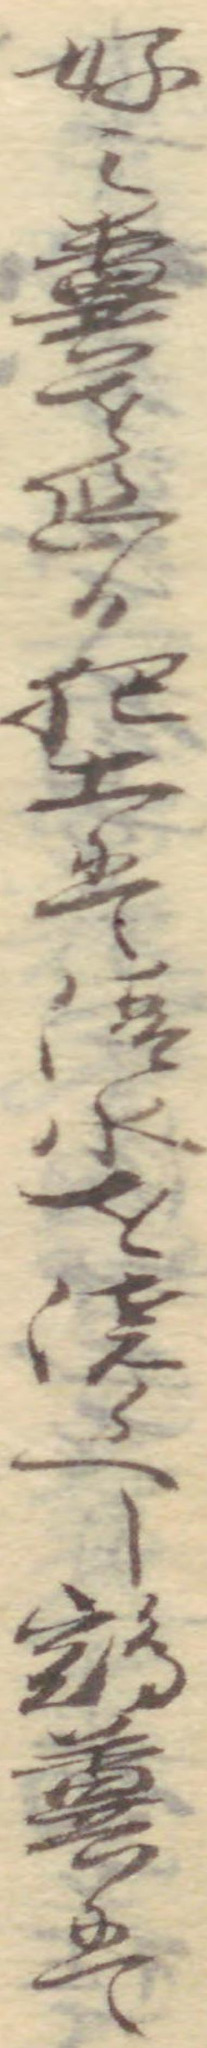好ミ糞を恐る肥土にて塩水を澆くへし鶏糞にて
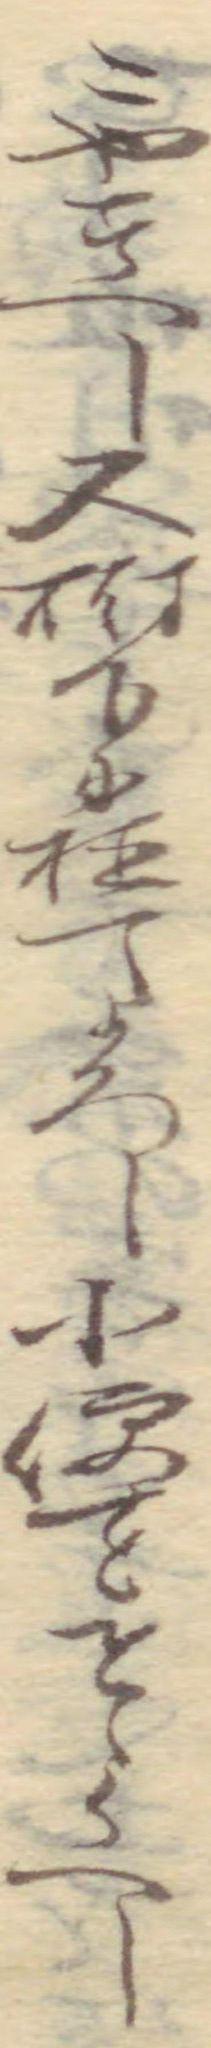こやすへし又樹下に植てよろし小便をそゝくへし
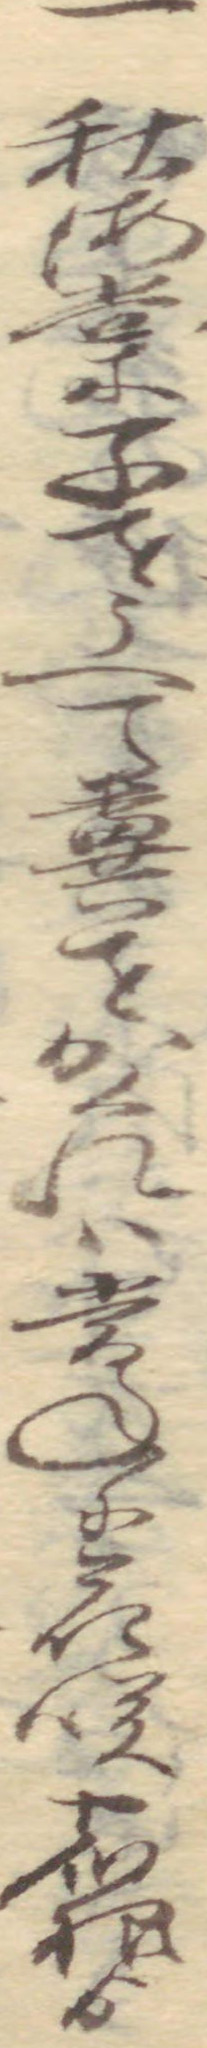一秋海棠子をうへて糞をかくれハ当年に花咲宿根ゟ
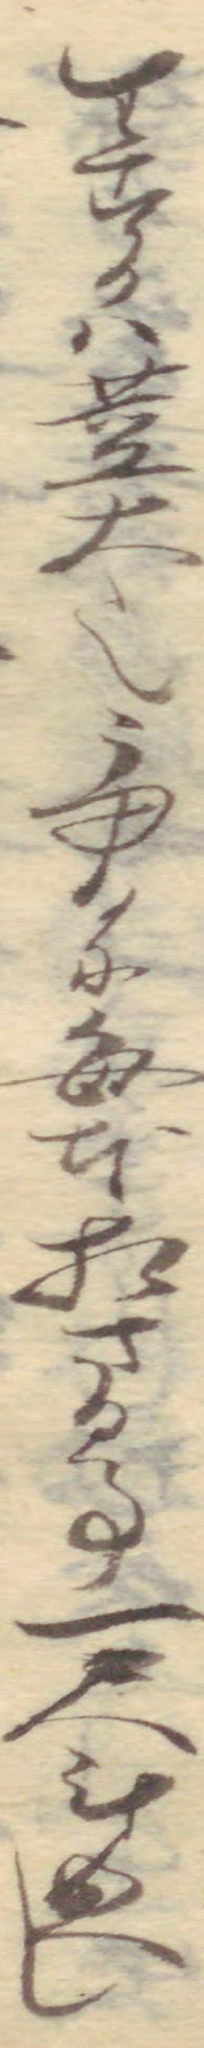生するハ茎大也うゆるに毎本折さる事一尺斗成へし
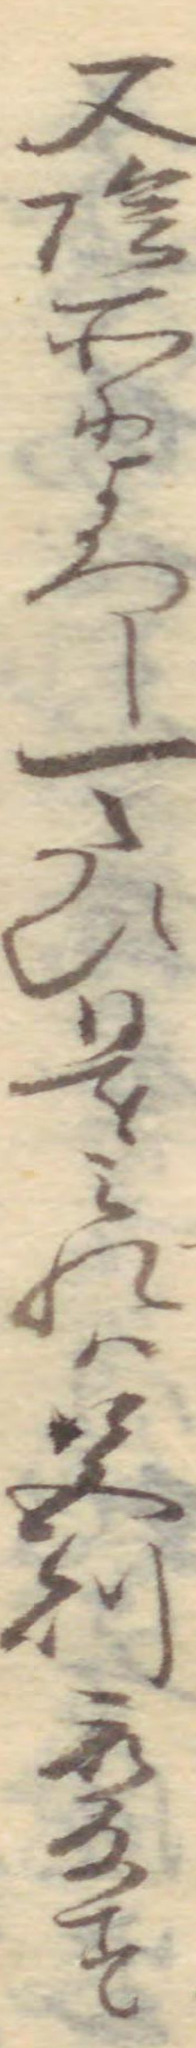又陰所によろし一たひ日をミれハ色則変す
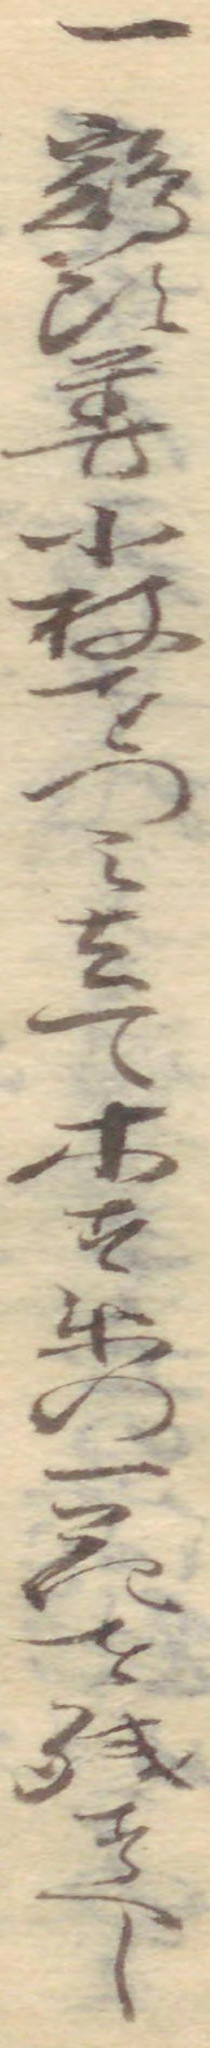一鶏頭華小枝をつミ去て木すえの一花を残すへし
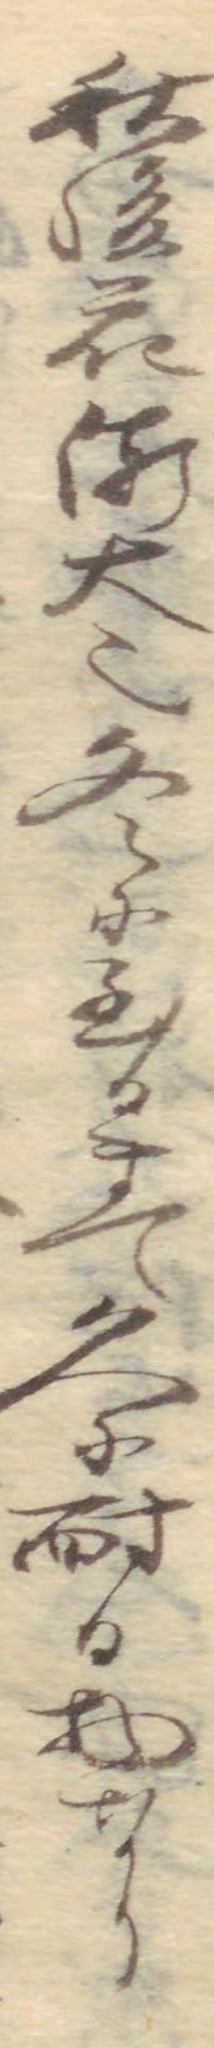秋後花漸大也冬に至るまて久に耐る物なり
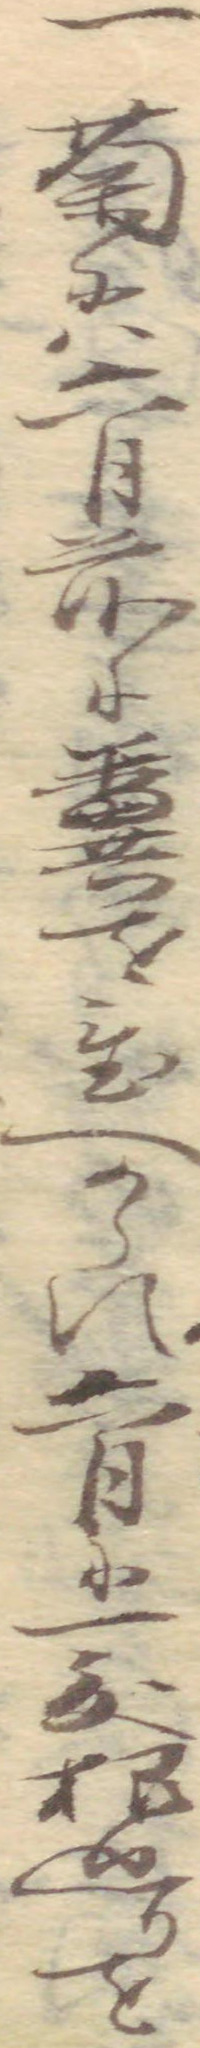一菊にハ六月前に糞を置へからす六月に一度根廻りを
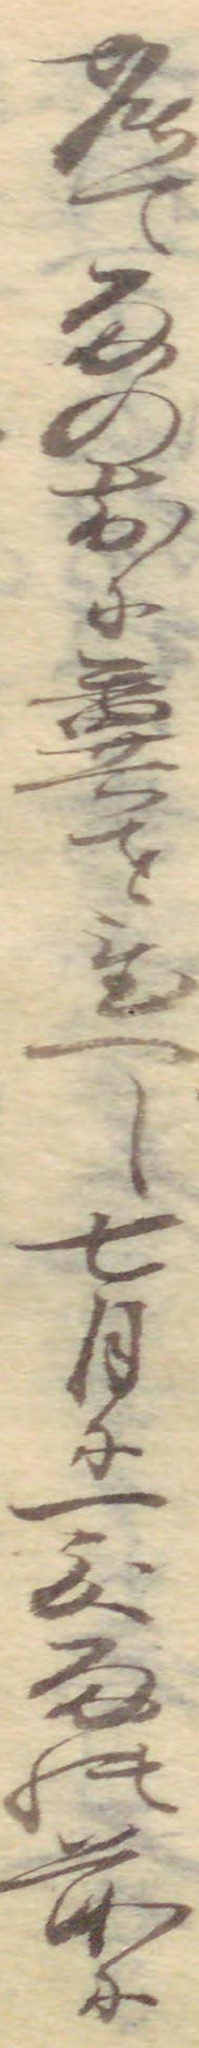堀て雨の前に糞を置へし七月に一度雨の前に
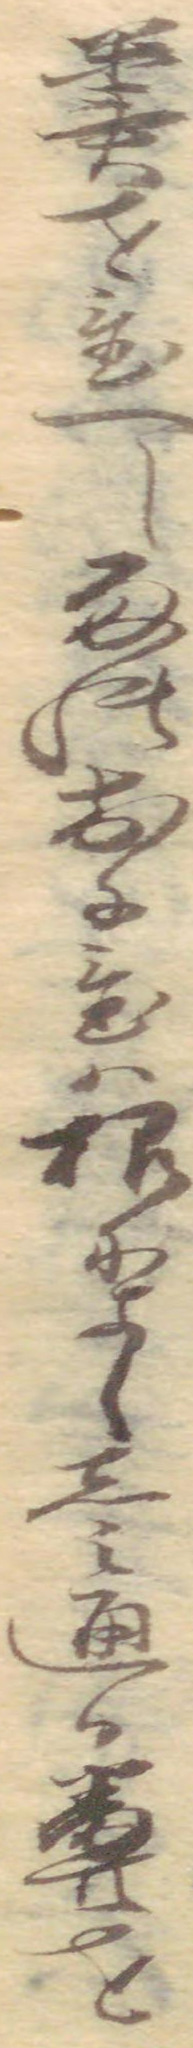糞を置へし雨のまえに前に置ハ根によくしミ通る糞を

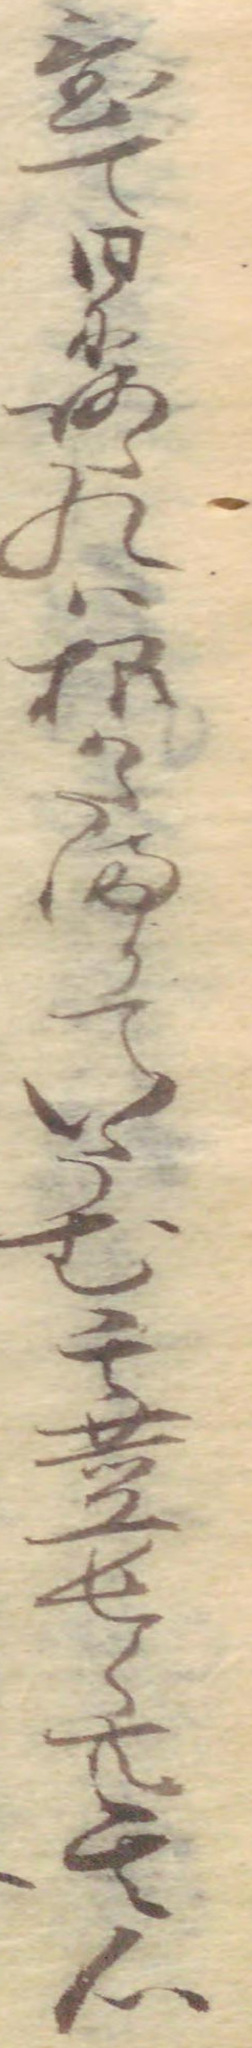置て日にあたれハ根かたまりていたむ其茎長く共其心
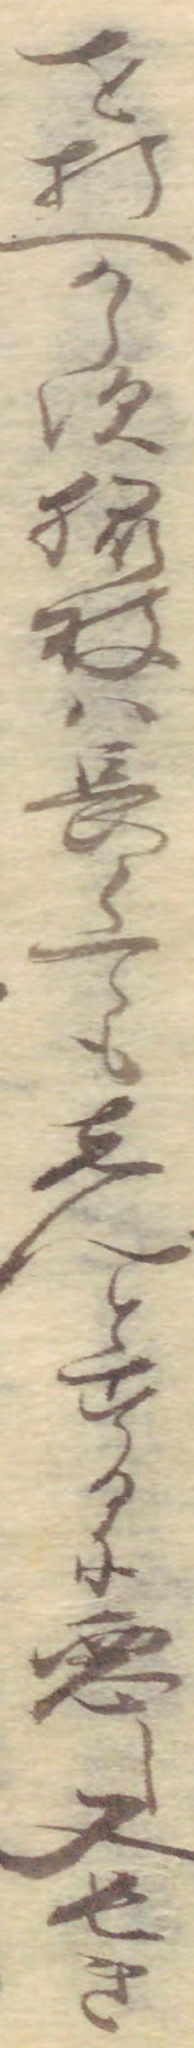を折へからす脇枝ハ長くてもしんとするに悪し又長き
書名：鶯宿雑記. 巻199-200
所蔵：国立国会図書館 National Diet Library, JAPAN
